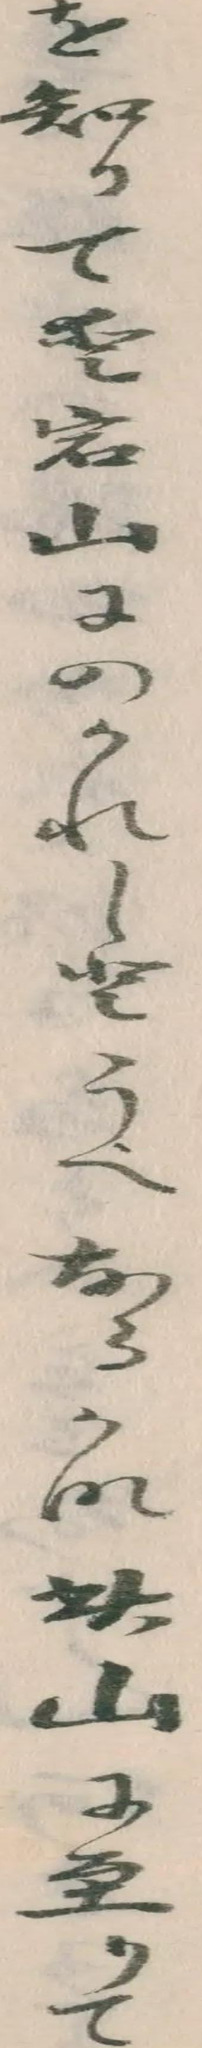を知りて愛宕山にのかれしとうへなるかな此山に至りて
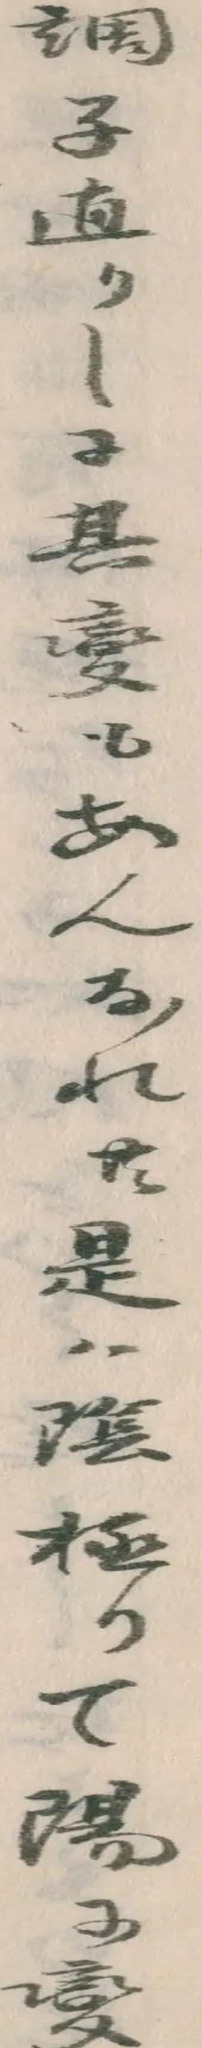調子直りしに其変もあんなれ共是は陰極りて陽に変
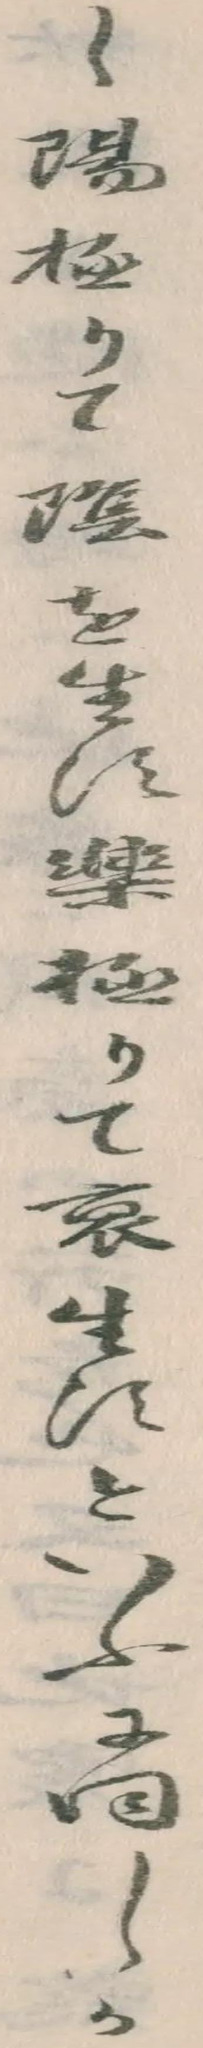し陽極りて陰を生す楽極りて哀生すといふに同しか
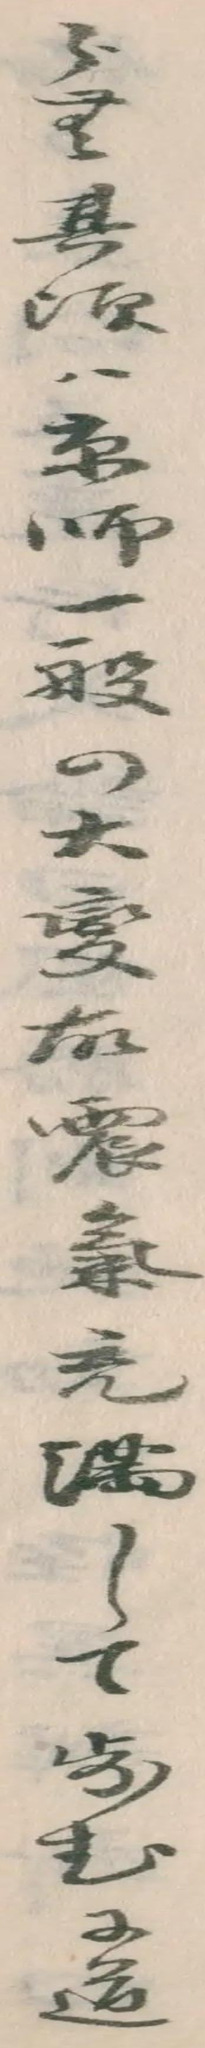らむ其頃は京師一般の大変故震気充満して歩むに道
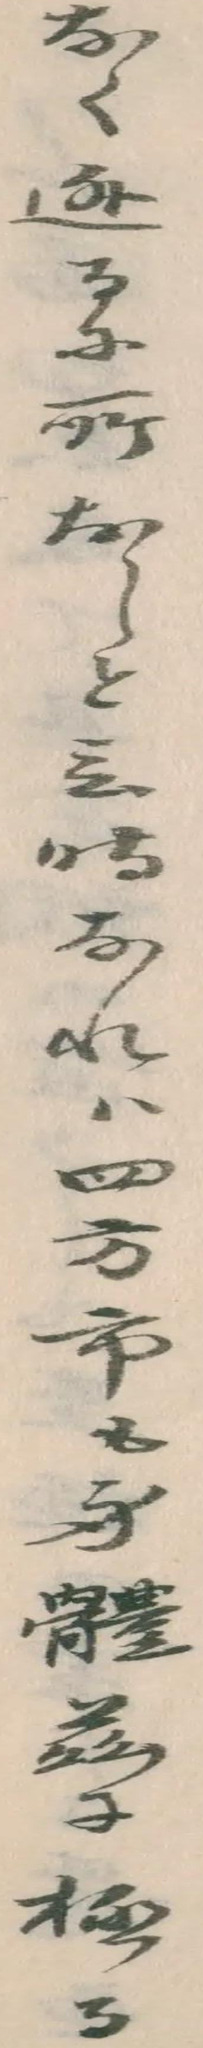なく逃るに所なしと言時なれは四方市も身体茲に極る

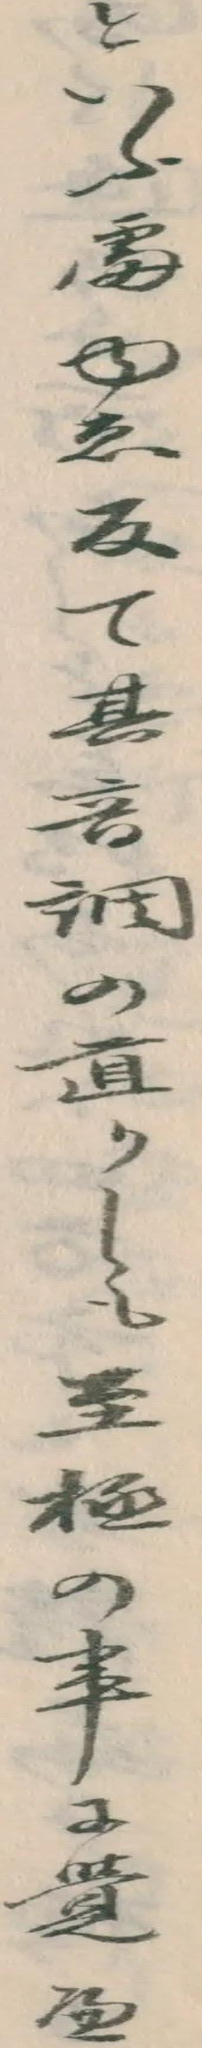といふ処ゆゑ反て其音調の直りしも至極の事に覚へ
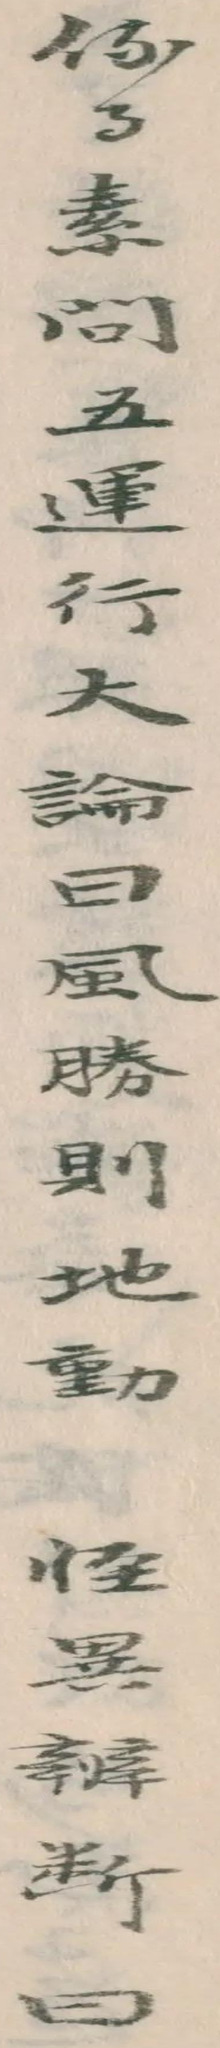侍る素問五運行大論曰風勝則地動怪異弁断曰
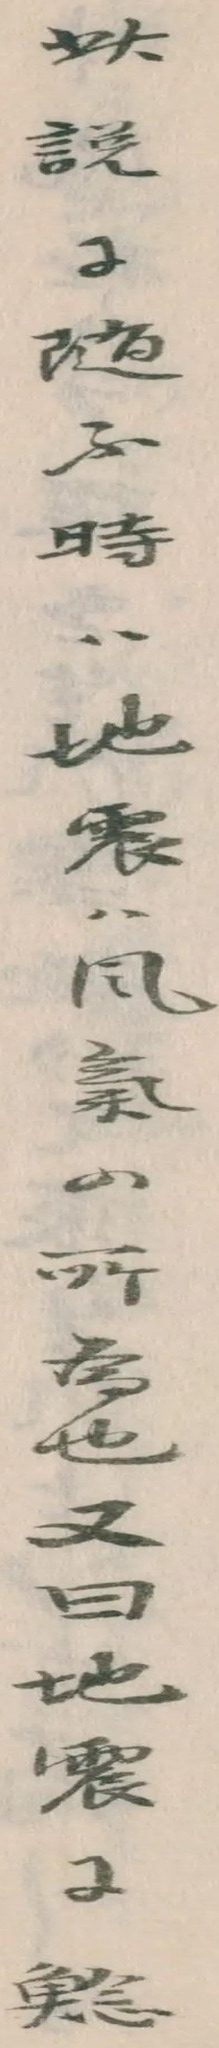此説に随ふ時は地震は風気の所為也又曰地震に鯰
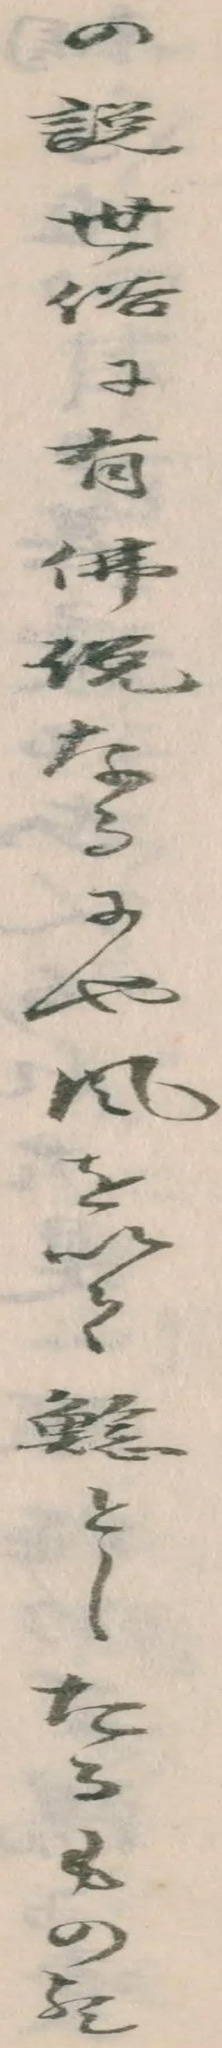の説世俗に有仏説なるにや風を以て鯰としたるもの歟
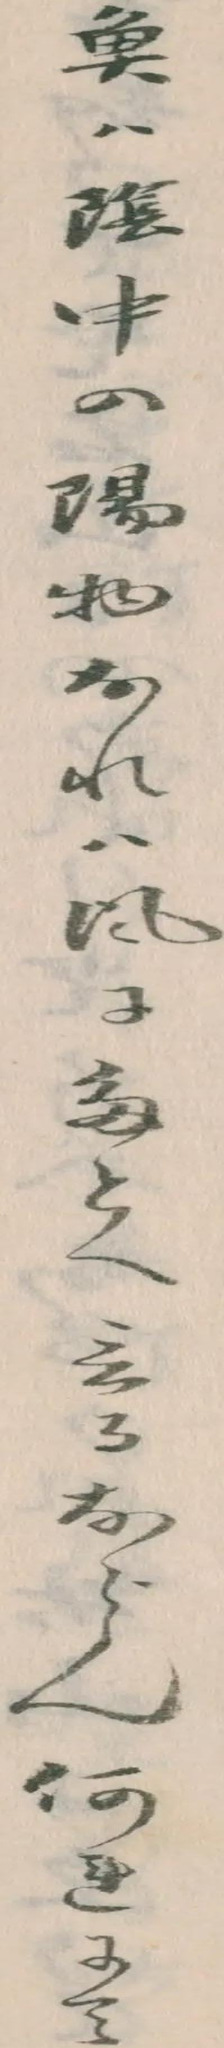魚は陰中の陽物なれは風にたとへ言るならん何れにて
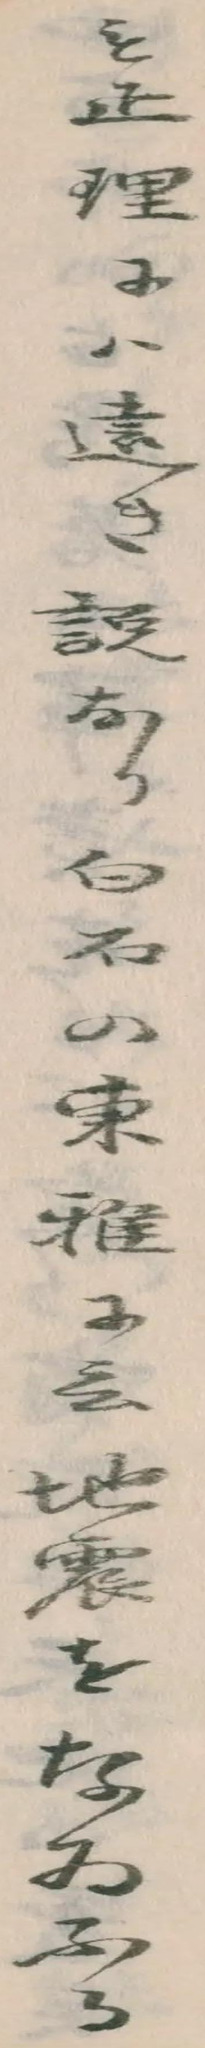も正理には遠き説なり白石の東雅に言地震をなゐふる
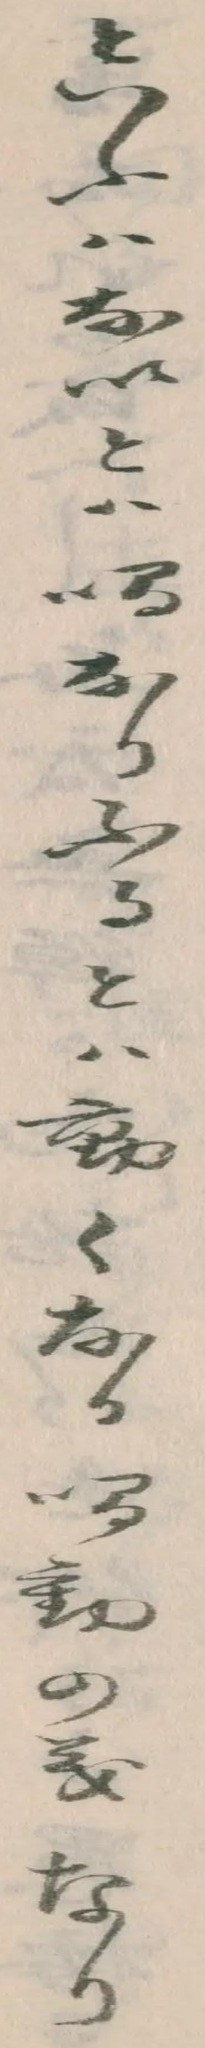といふはないとは鳴なりふるとは動くなり鳴動の義なり
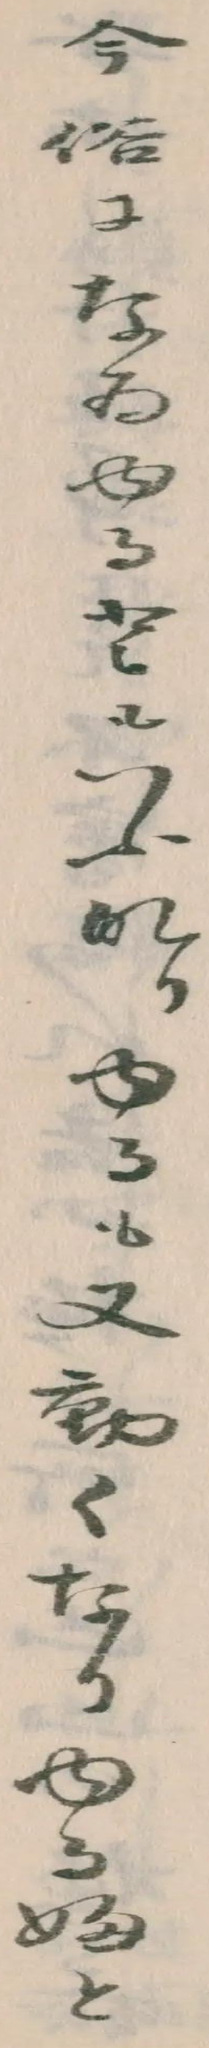今俗になゐゆるともいふなりゆるも又動くなりゆるふと
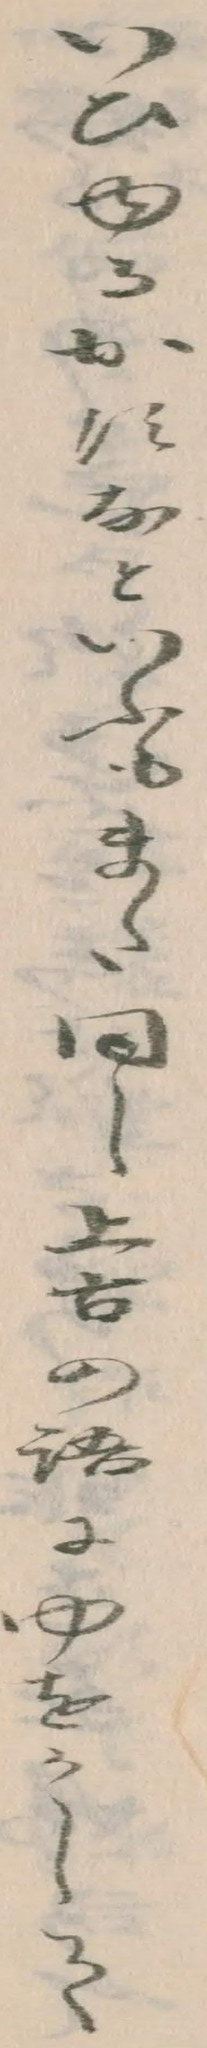いひゆるかすなといふもまた同し上古の語にゆをかして
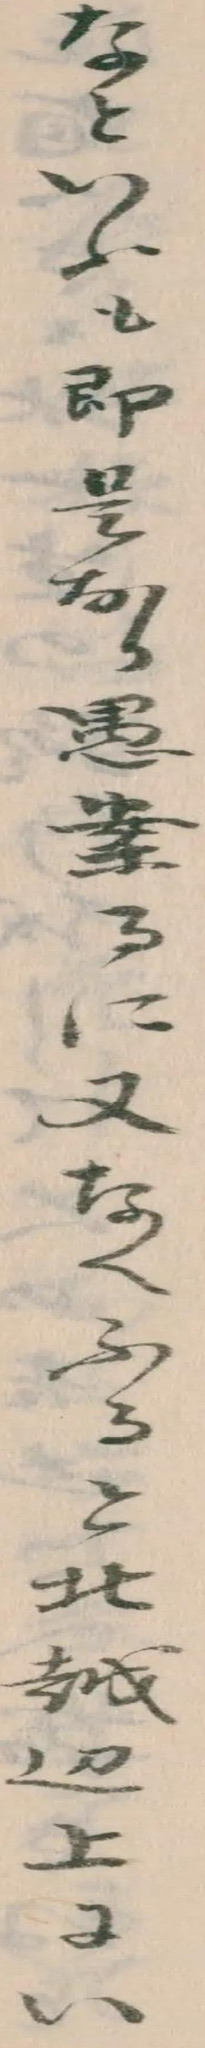なといふも即是なり愚案るに又なへふると北越辺土にい
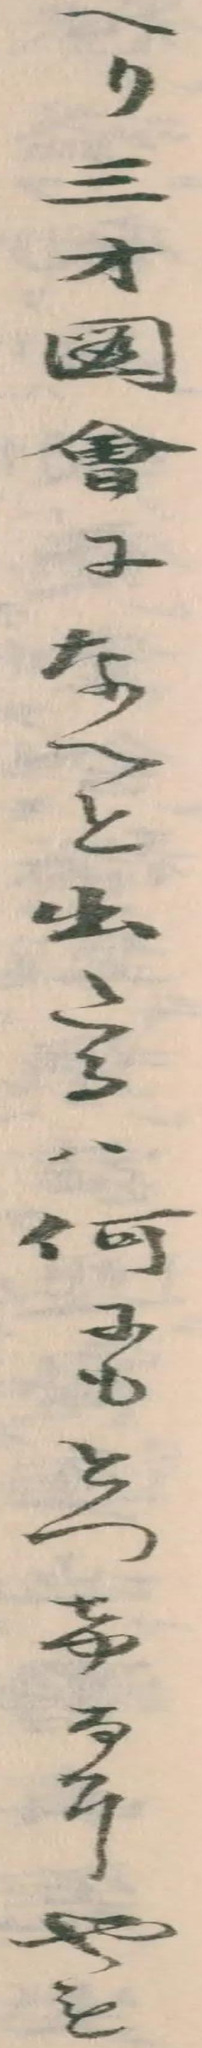へり三才図会になへと出たるは何にもとつけるにやも
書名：地災撮要. 巻11-12(地震之部)
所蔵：国立国会図書館 National Diet Library, JAPAN
